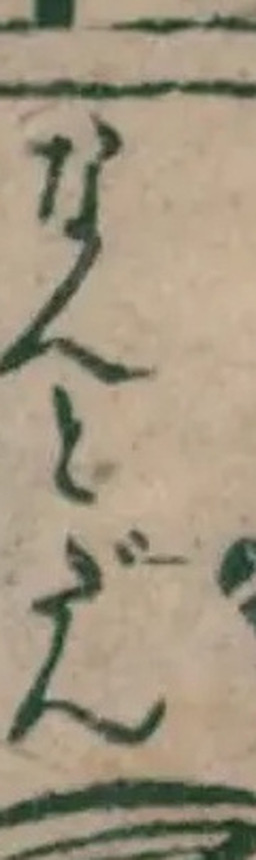なんとだん
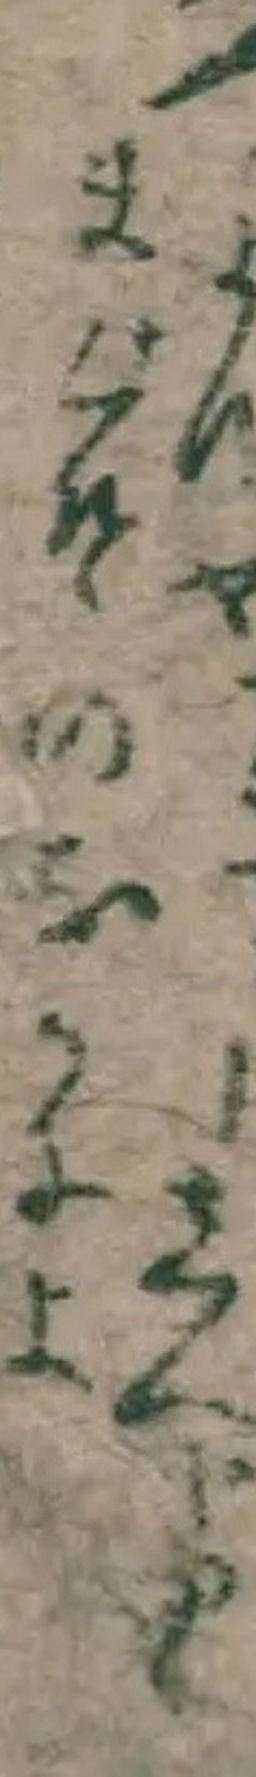まくそのなかによ
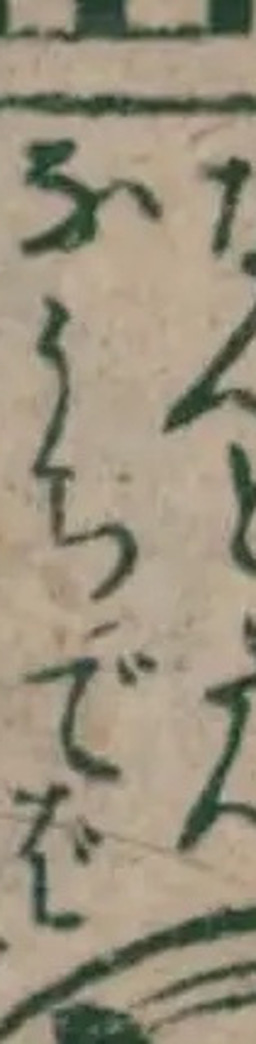なうちでば
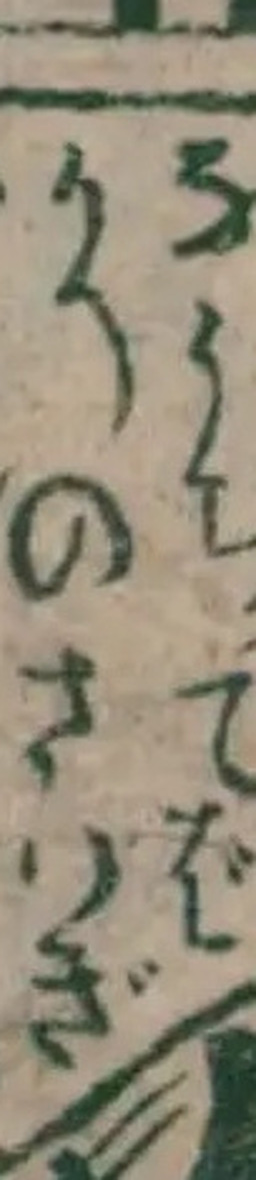かりのさはぎ
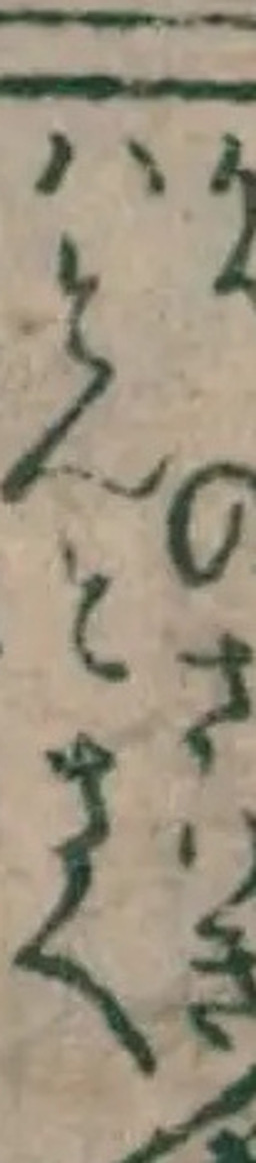はとんとさへ
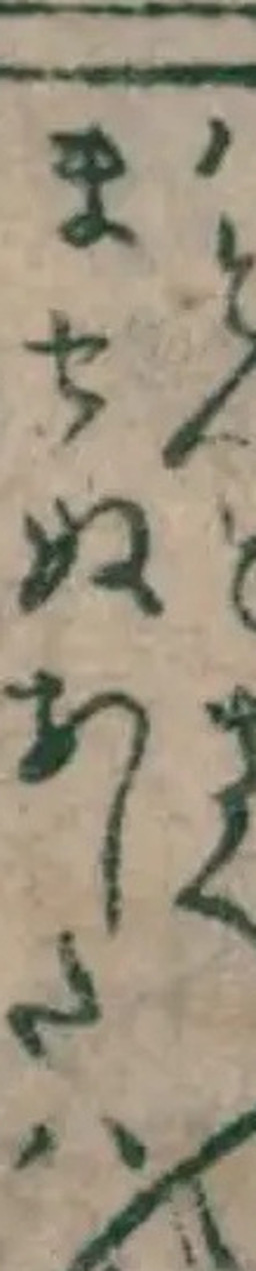ませぬあしたは
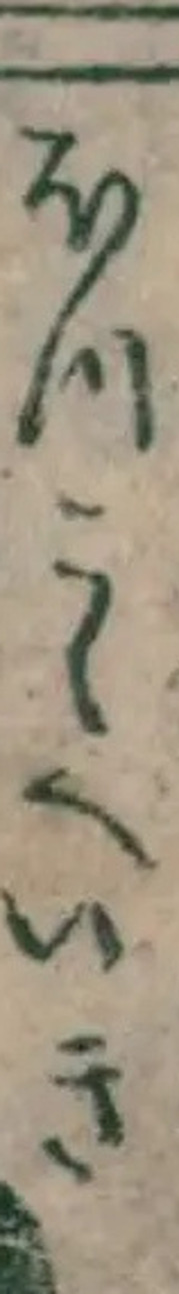ほつこくへいき
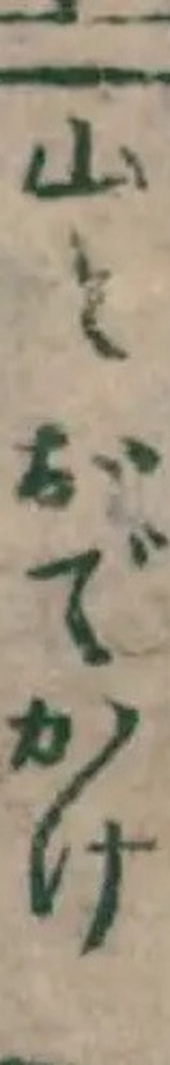山とおでかけ
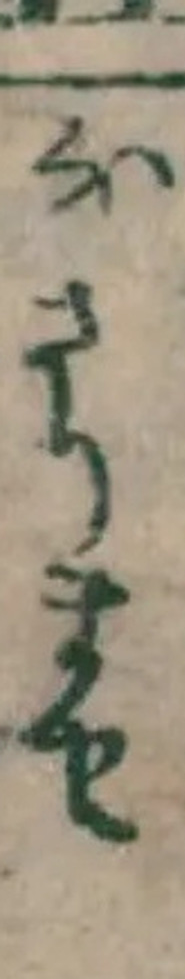なさりませ
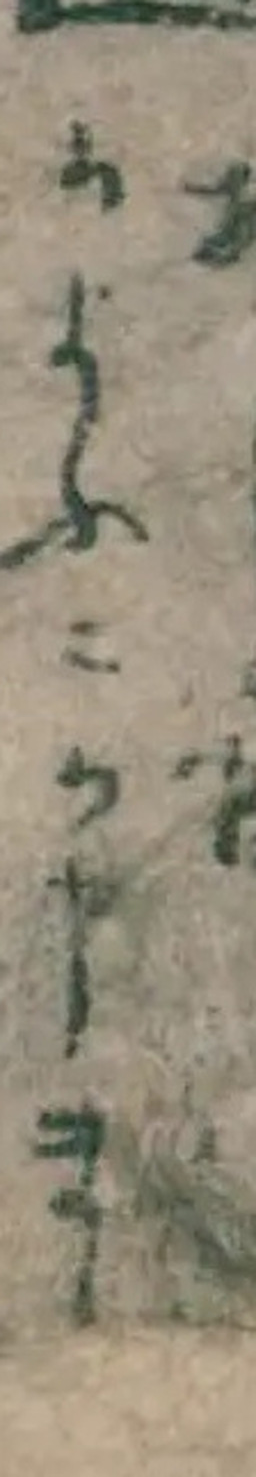かよふにか申ました

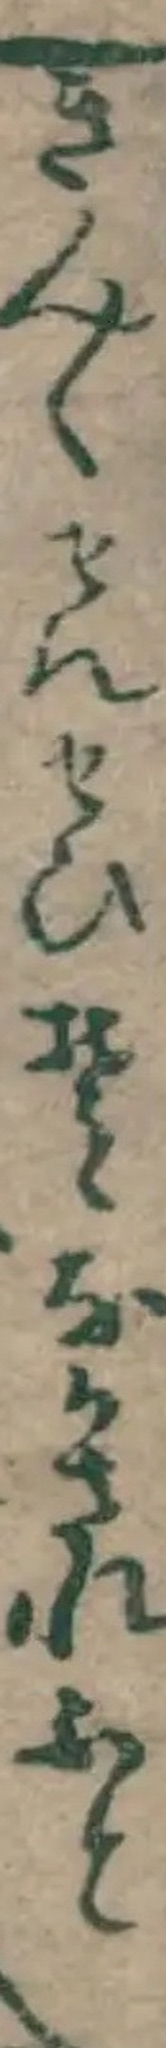きん〳〵せんせひそゝなかされふと
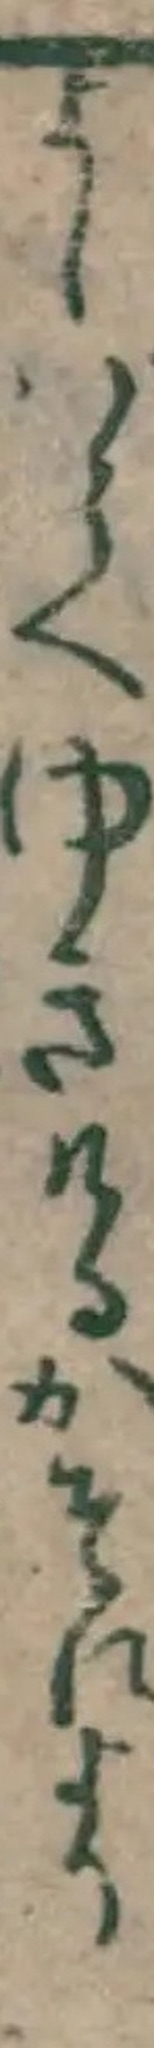よしはらへゆきけるかそれより
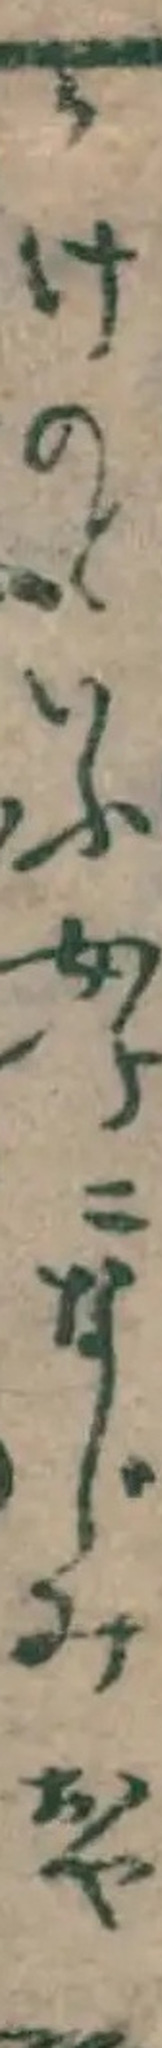かけのといふ女郎になじみおや
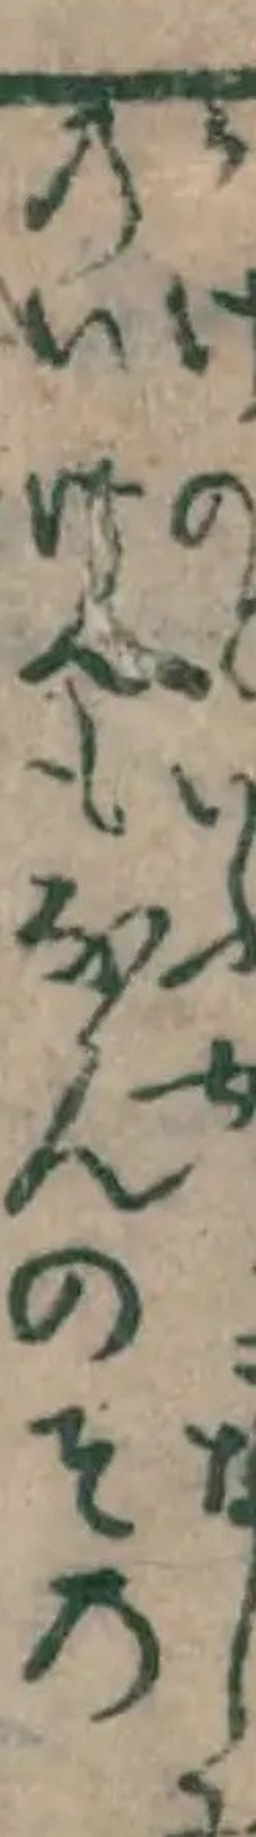のいけんもなんのその
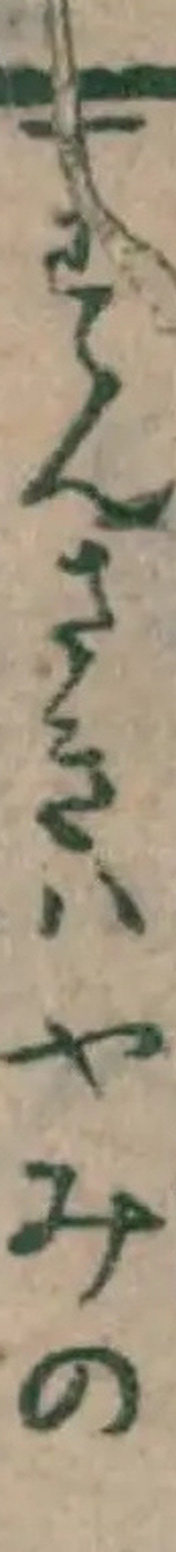一すんさきはやみの
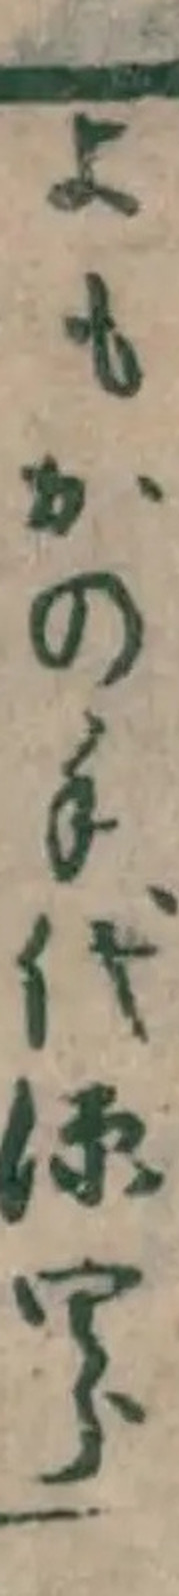よもかの手代源四郎
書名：金々先生栄花夢 : 2巻
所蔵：国立国会図書館 National Diet Library, JAPAN
